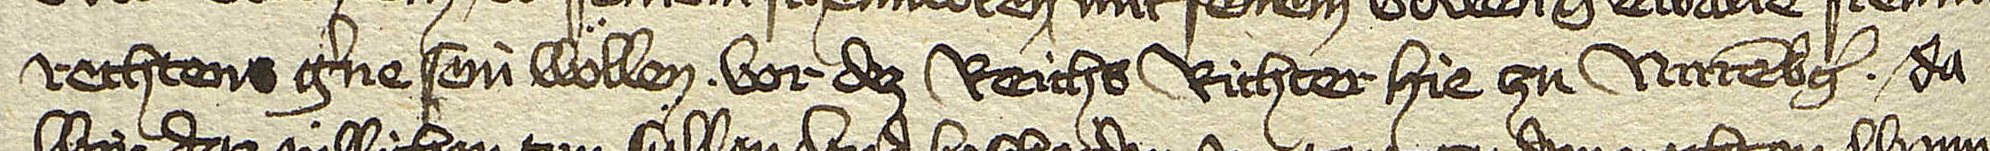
rechtens g*ne ſein wöllen . vor deʒ Reichs Richter hie cʒu Nure*b*g . / da
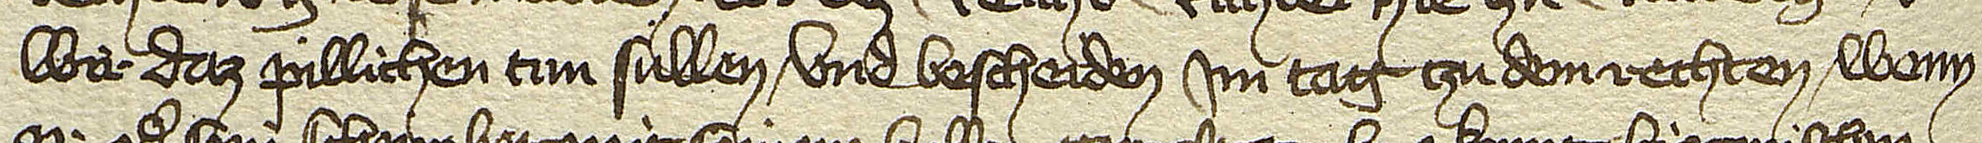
wir daʒ pillichen tun ſüllen / vnd beſcheiden Im tag cʒu dem rechten / wenn
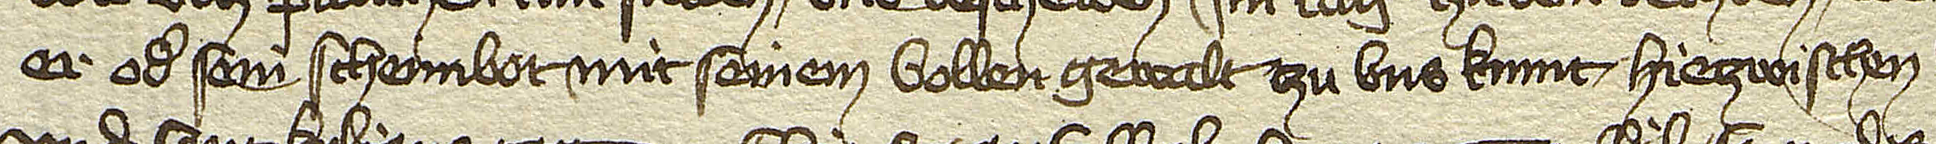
er od* ſein ſcheimbot mit ſeinem vollen gewalt cʒu vns kumt hiecʒwiſchen
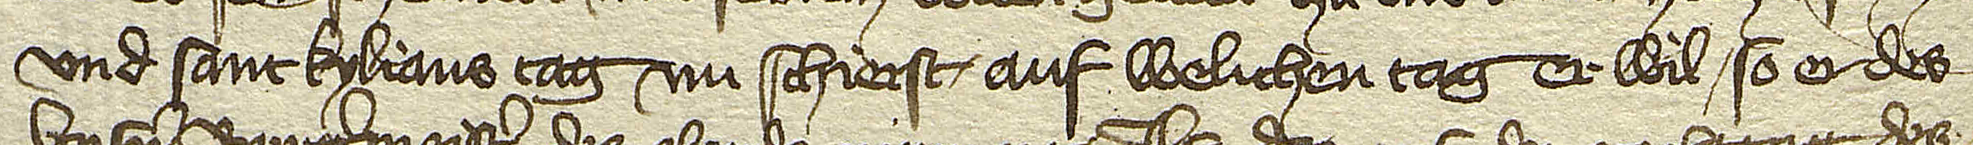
vnd ſant kylians tag nu ſchierſt / auf welichen tag er wil / ſo er des
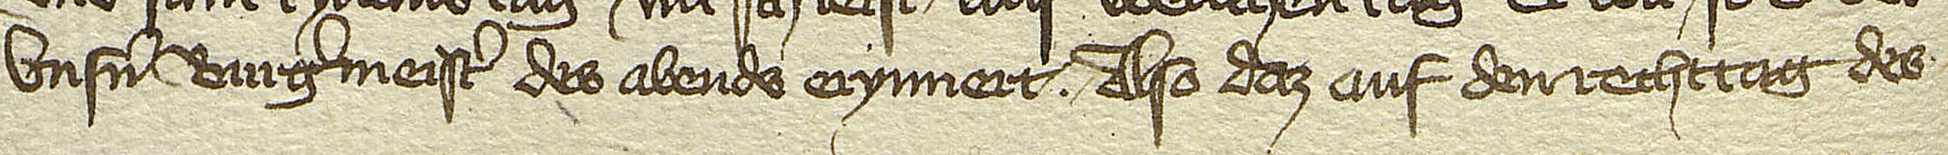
vnſn* Burg*meiſt* des abends erynnert . / Alſo daʒ auf den rechttag des
